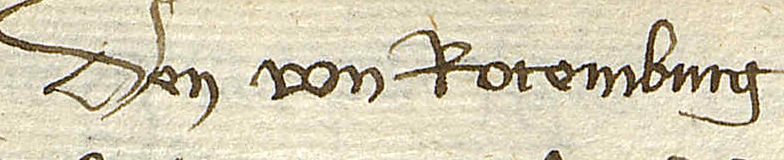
Den von Rotemburg
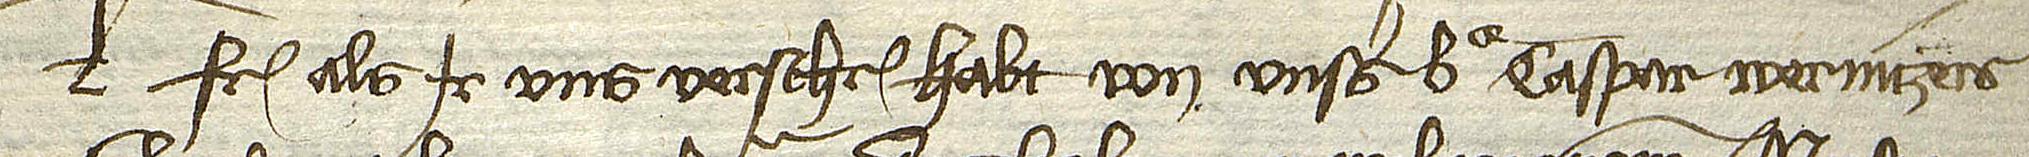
L* fr* als Ir vns verſchr* habt von vnſ*s b* Caſpar wernicʒers
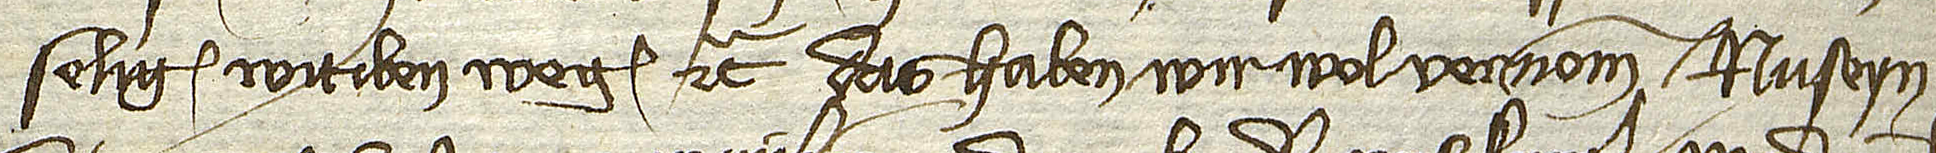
ſelig* witiben weg* ec* das haben wir wol vernom* / Nu ſeyn
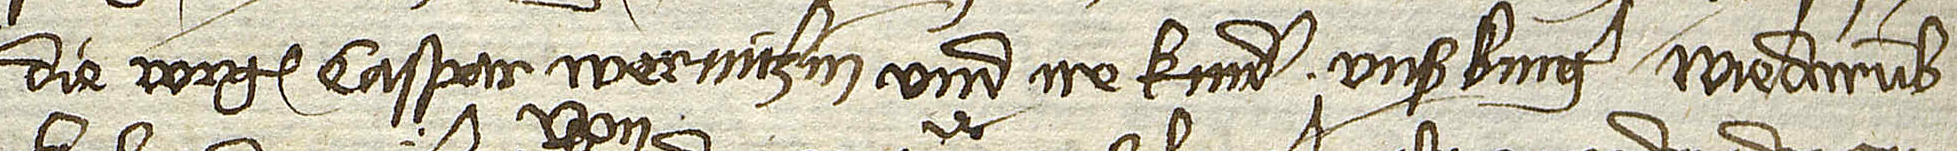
die vorg* Caſpar wernicʒ*in vnd ire kind* . vnſ* burg* / wie darub*
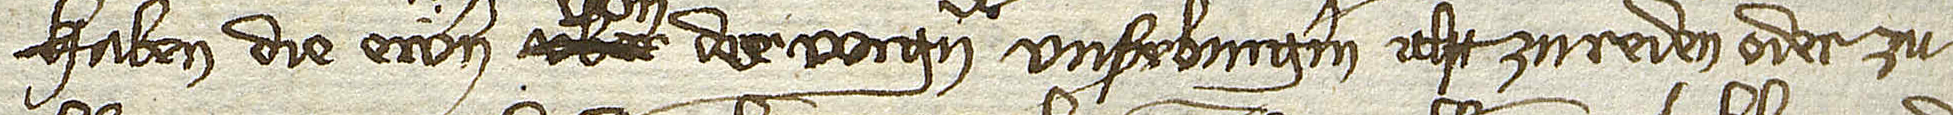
haben die eẅ*n vber der vorgn* vnſ*r burg*in icht ʒu reden oder ʒu
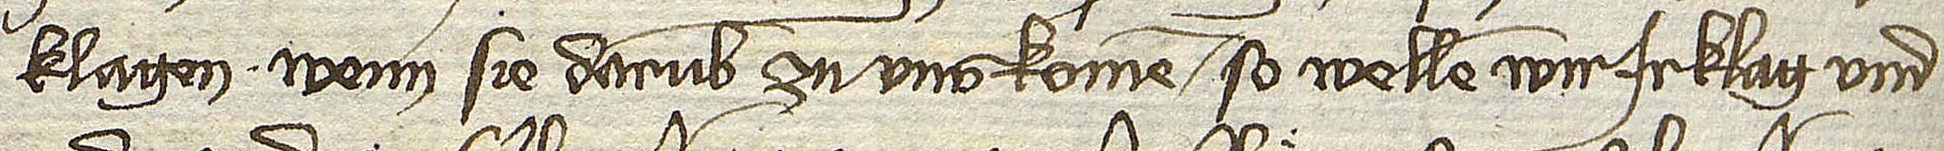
klagen . wenn ſie darub* cʒu vns kome* / ſo welle* wir Ir klag vnd
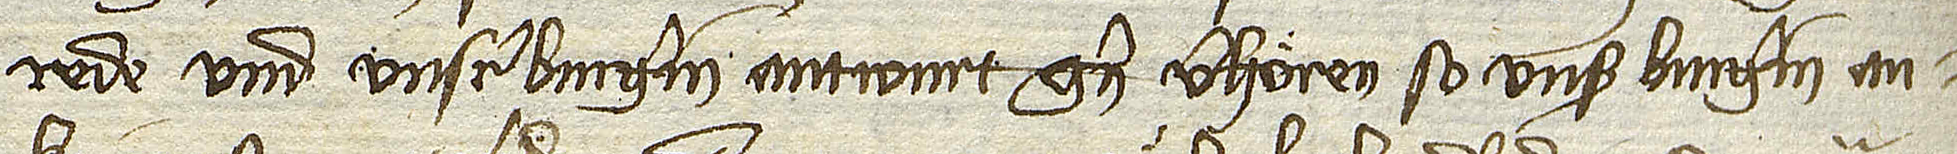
rede vnd vnſ*r burg*in antwurt g*n v*hören ſo vnſ* burg*in an =
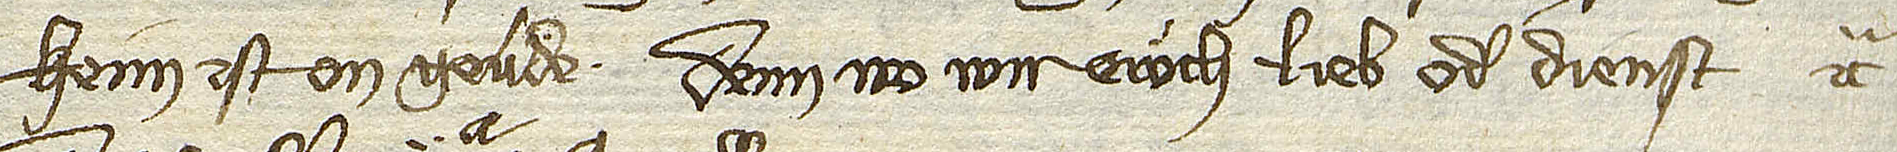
heim iſt on geude . Denn wo wir eẅch lieb od* dienſt ec*
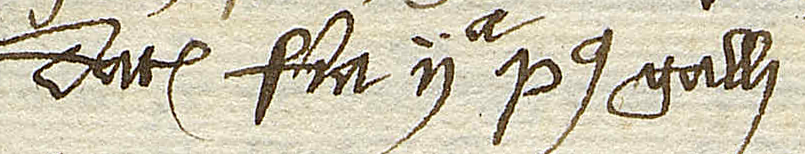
Dat* fia* ii* p* galli
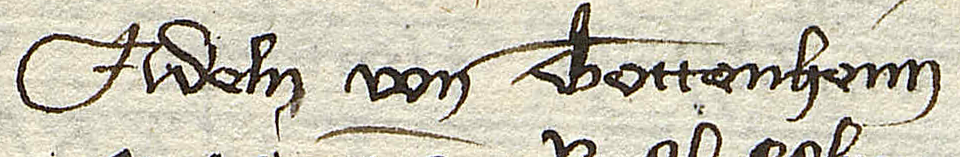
Adeln von bottenheim
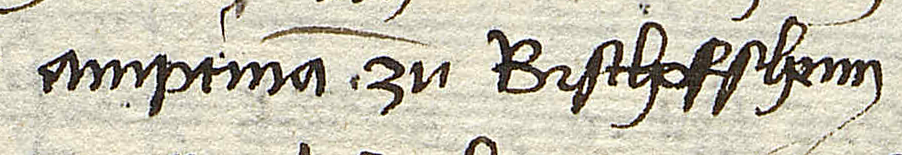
amptma* ʒu Biſchoffheim
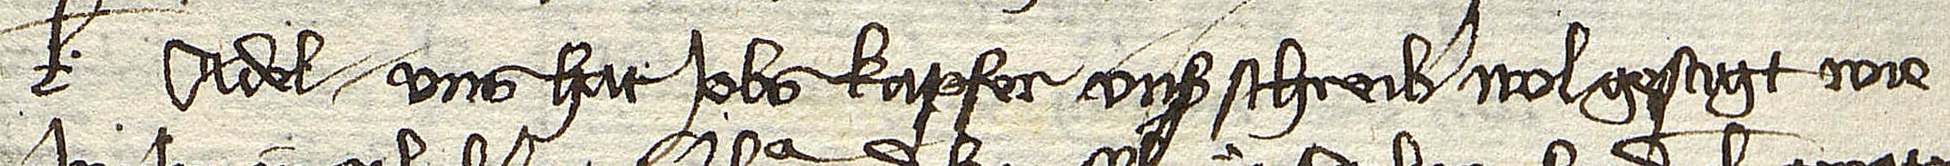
L* Adel / vns hat Iobs Kapfer vnſ* ſchreib* wol geſagt wie
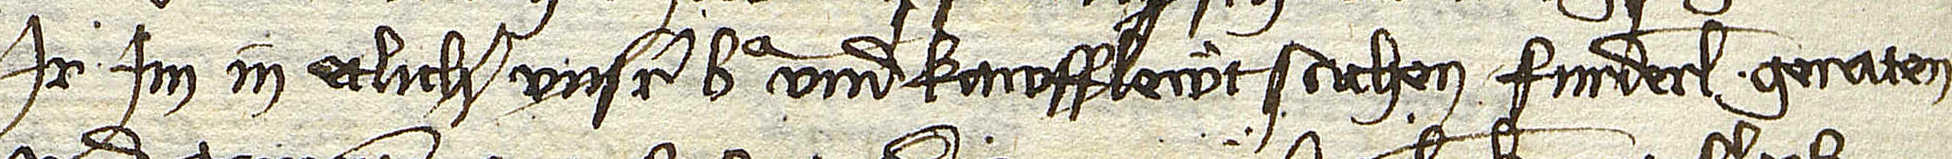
Ir Im in etlich* vnſ*r b* vnd kawffleẅt ſachen furderl* . geraten
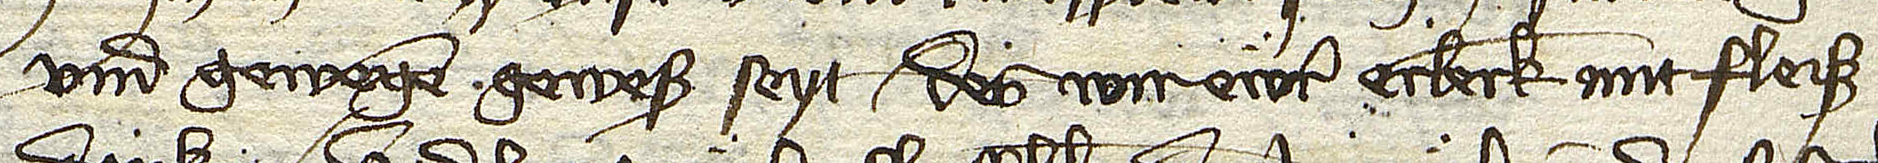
vnd gewege* geweſ* ſeyt / Des wir eẅ*r erberk* mit fleiſʒ
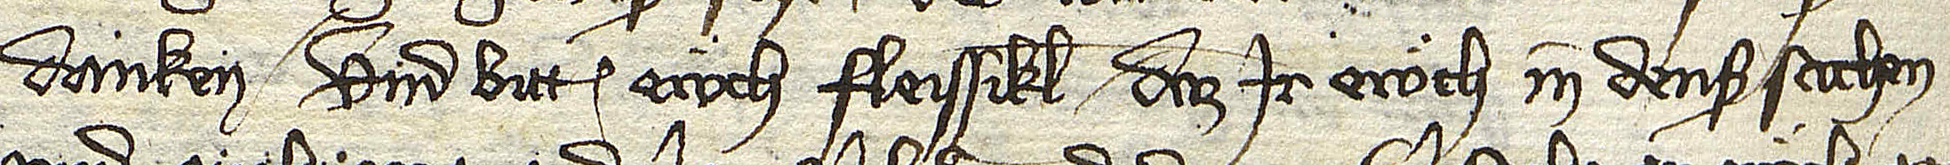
danken / Vnd bitt* eẅch fleiſſikl* / daʒ Ir eẅch in denſ* achen
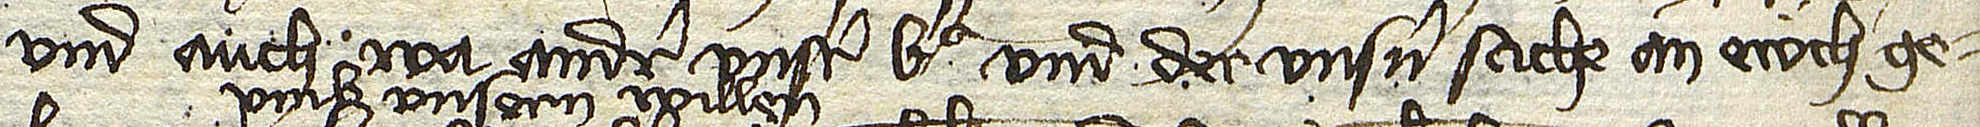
vnd auch von and*r vnſ*r b* vnd der vn*n ache an eẅch ge =
